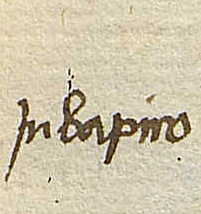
In bapiro
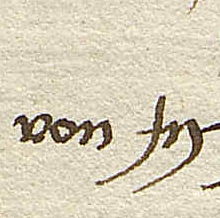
von In
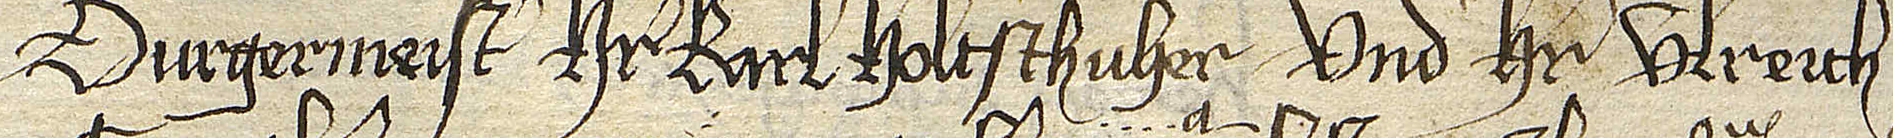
Burgermeiſt* Hr* Karl Holtſchuher / Vnd Hr* Vlreich
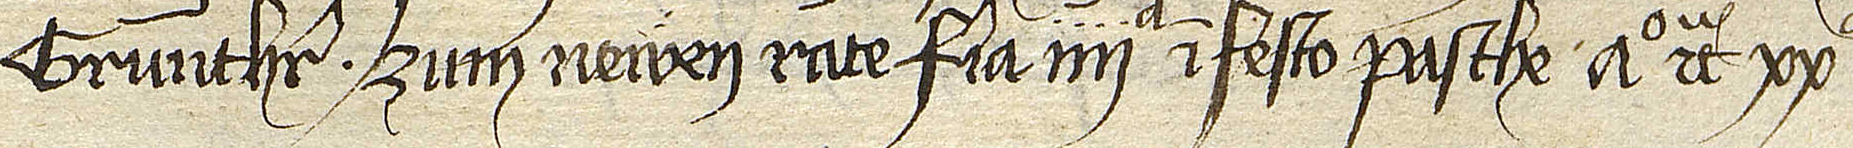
Grunthr* . ʒum neẅen rate fi*a iiii* i* feſto paſche A* ec* xx*
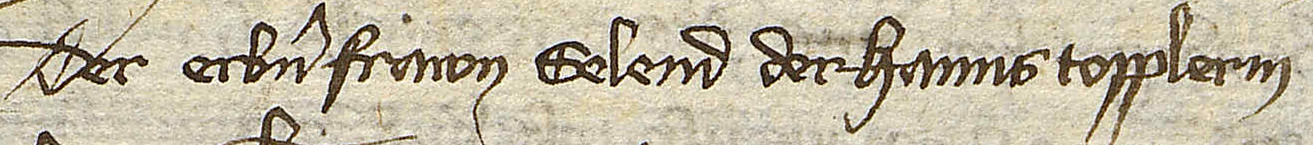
Der erbn* frawn Selend der hanns topplerin
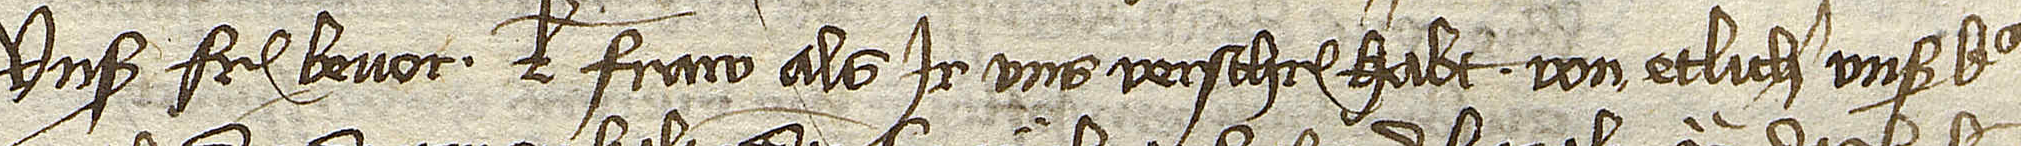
Vnſ* fr* beuor . L* fraw als Ir vns verſchr* habt . von etlich* vnſ* b*
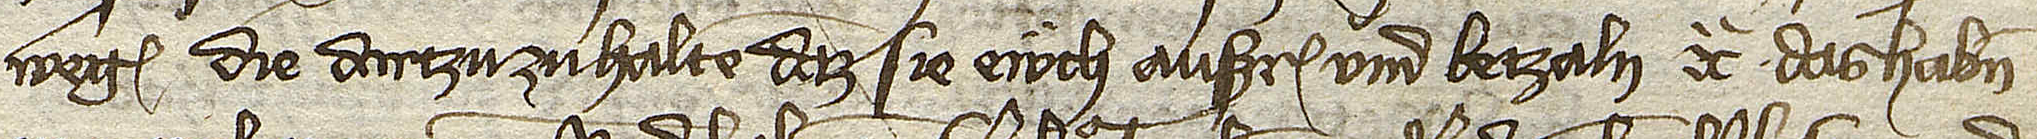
weg* die darcʒu ʒu halte* daʒ ſie eẅch auſʒr* vnd becʒaln ec* . das habn*
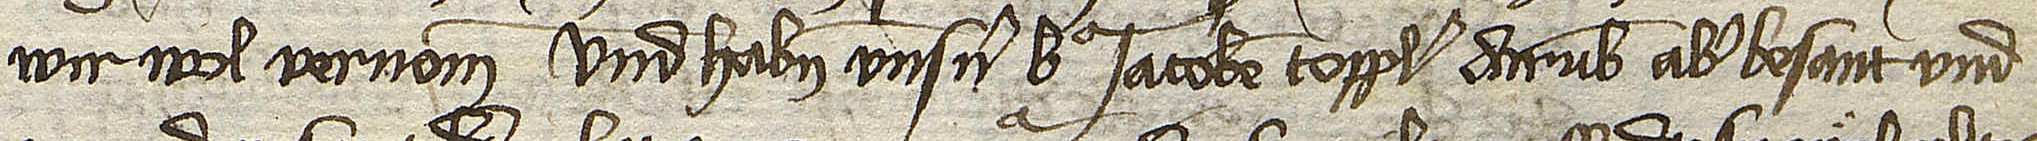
wir wol vernom* vnd habn* vnſn* b* Iacobe* toppl* darub* ab* beſant vnd
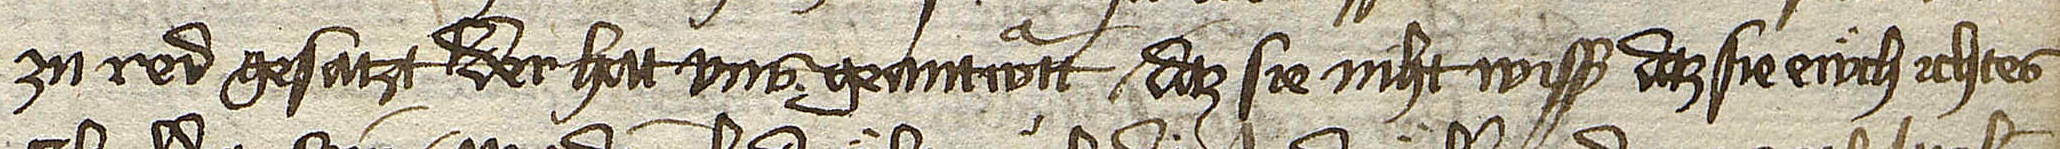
ʒu red geſacʒt Der hat vns geantw*tt / Daʒ ſie niht wiſſ* daʒ ſie eẅch ichtes
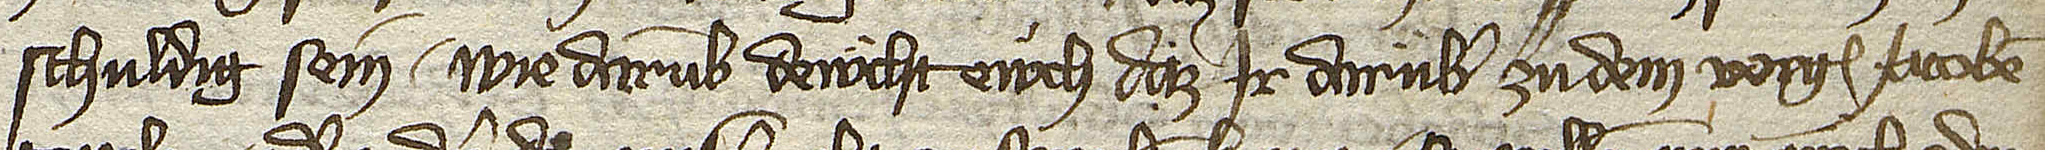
ſchuldig ſein / wie darub* deẅcht eẅch daʒ Ir darüb* ʒu dem vorg* Iacobe*
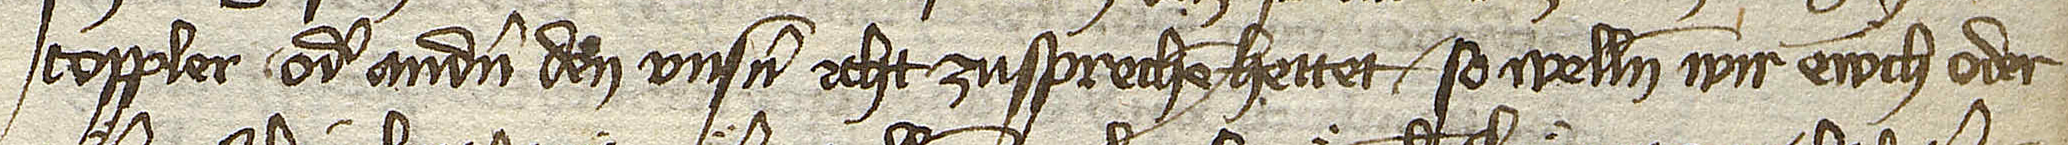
toppler / od* andn* den vnſn* icht ʒuſpreche* hettet / ſo welln* wir eẅch oder
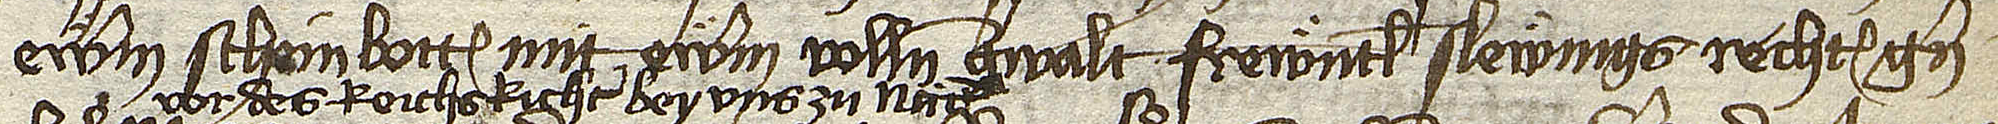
eẅ*m ſcheinbott* mit eẅ*m volln* gwalt freẅntl* ſleẅnigs recht* g*n
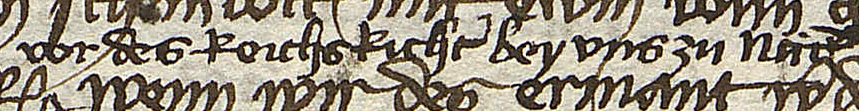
vor des Reichs Richt* bey vns ʒu Nür*
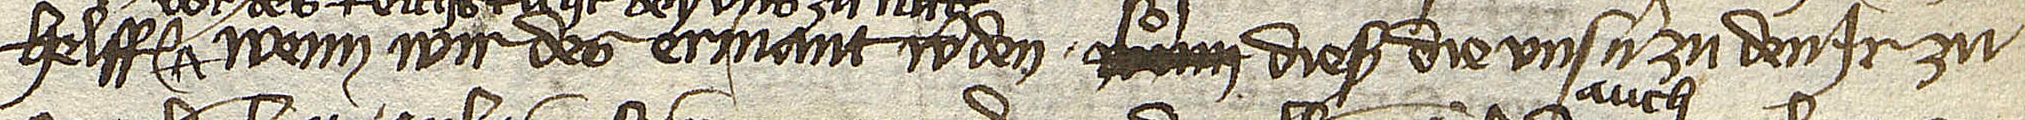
helff* wenn wir des ermant w*den / wenn dieſ* die vnſn* ʒu den Ir ʒu
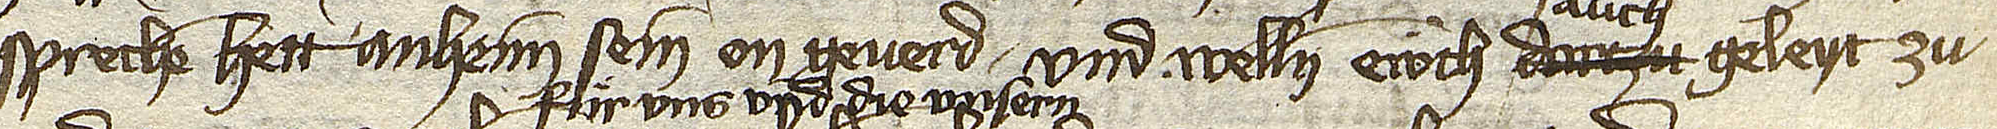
ſpreche* hett anheim ſein on geuerd / vnd welln* eẅch darcʒu geleyt ʒu
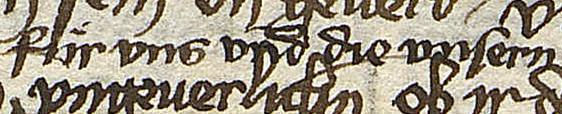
für vns vnd die vnſern
